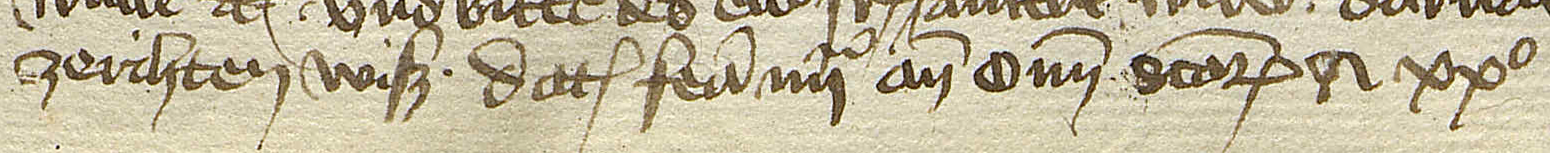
cʒurihten wiſʒ . dat* fea* iiii* an* Omi* sco* A xx*
